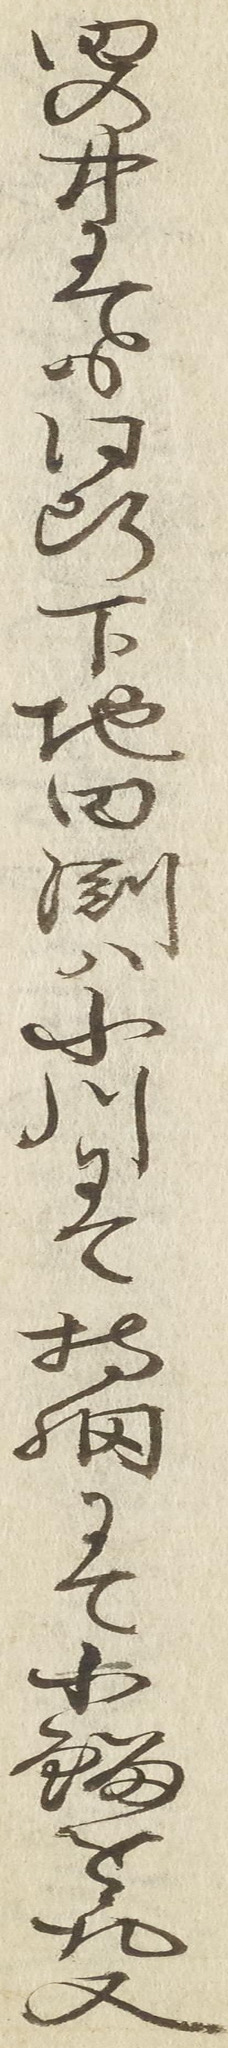田の中にても同断下地田渕は小川にて持網にて小鯔を取又
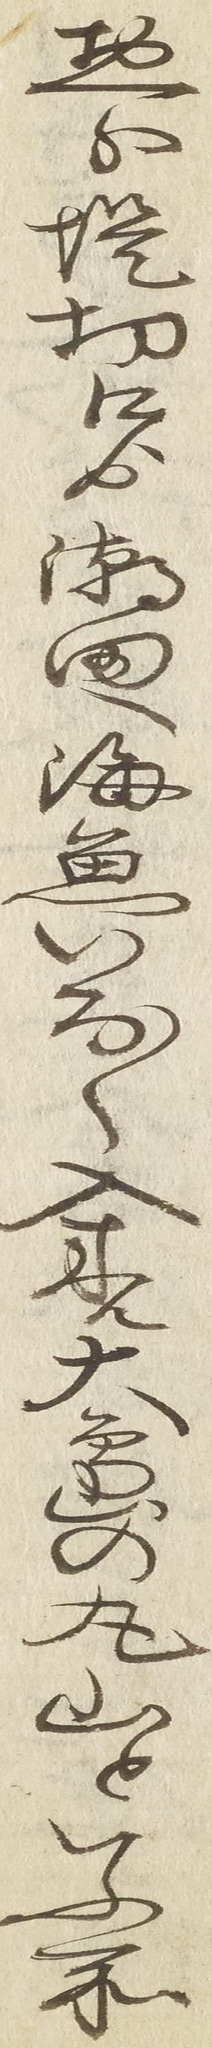惣分堤切口より潮田へ海魚いろ〳〵入来る大島の丸山といふ前
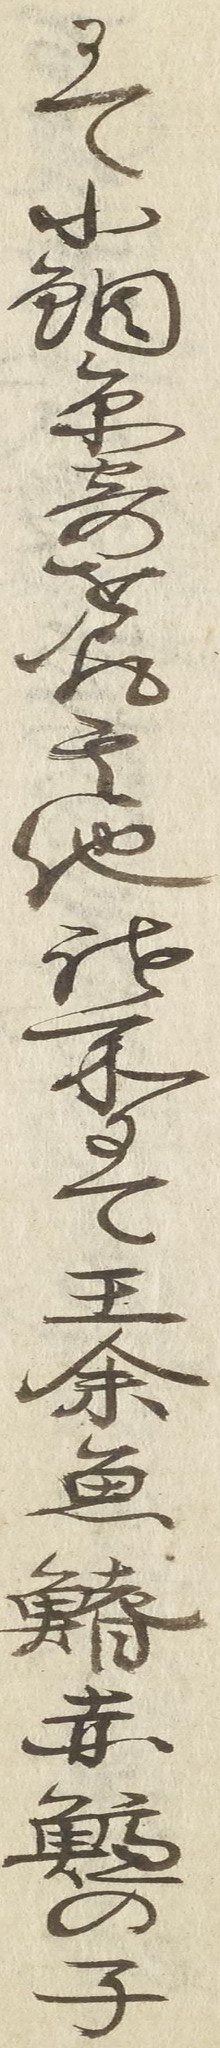にて小鯛糸寄を取其他諸所にて王余魚鰭赤鱸の子
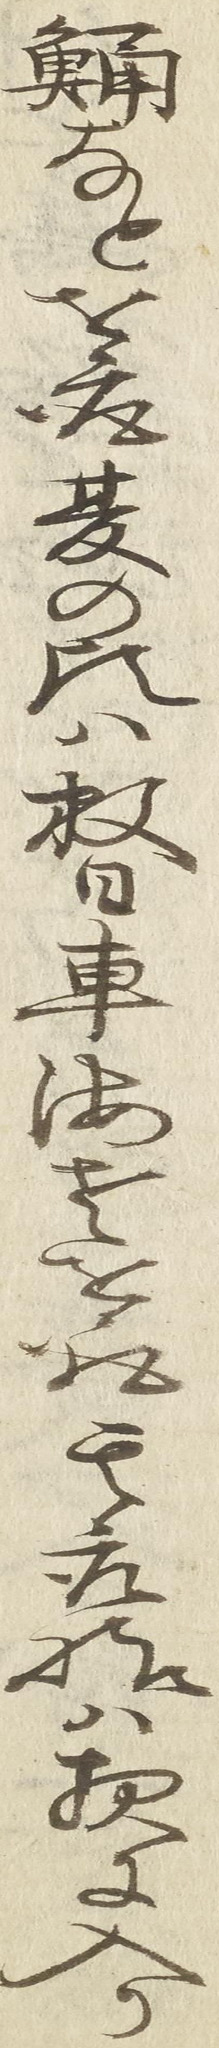鯒なとを取夏頃は数日車海老を取其取様は夜に入り
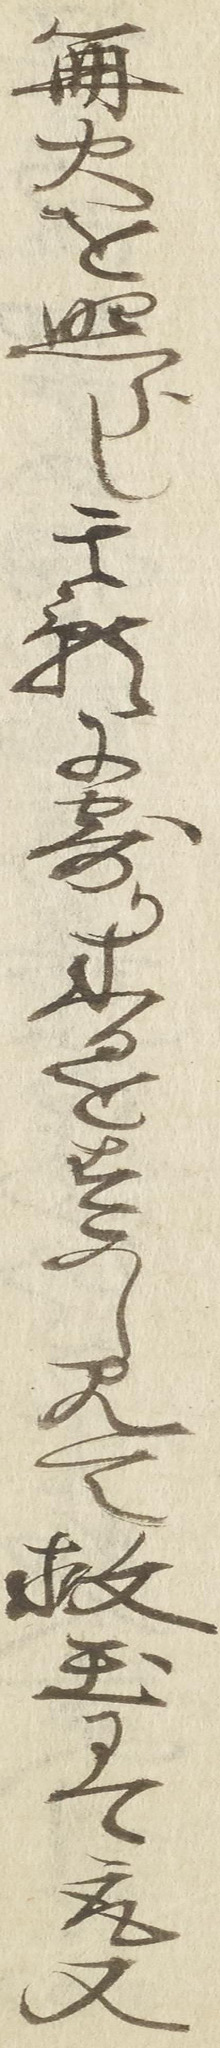篝火を照らし其影に寄り来るをすかし見て救玉にて取又
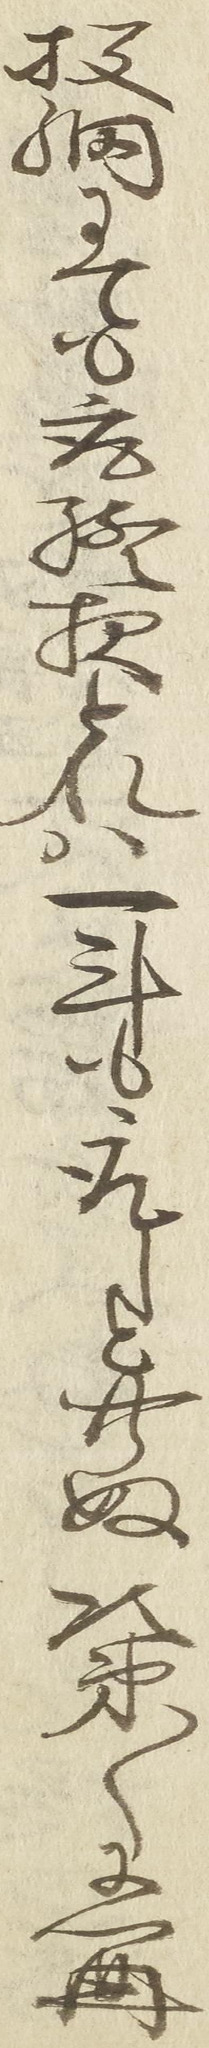投網にても取終夜とれは一斗も取候と聞ぬ次第〳〵に篝
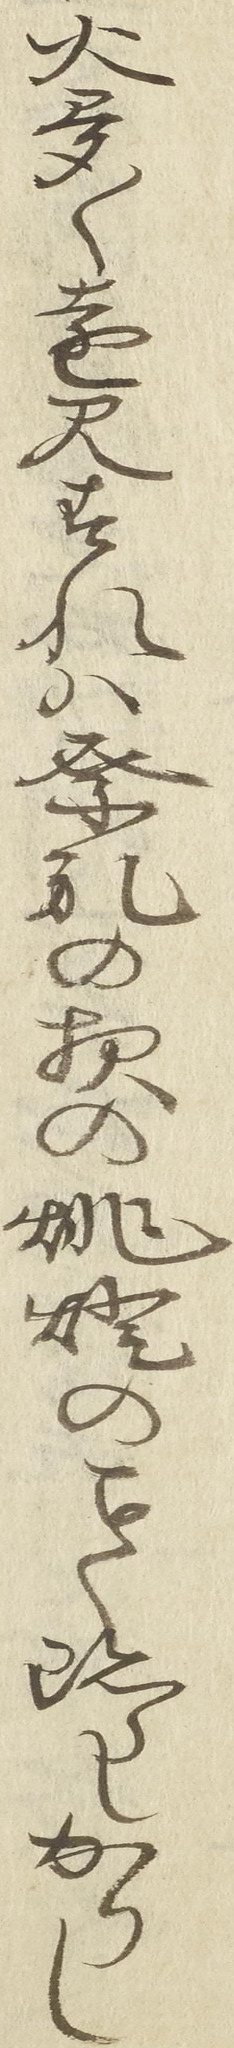火多く遠見すれは祭礼の夜の烑燈のことく珍らしかりし

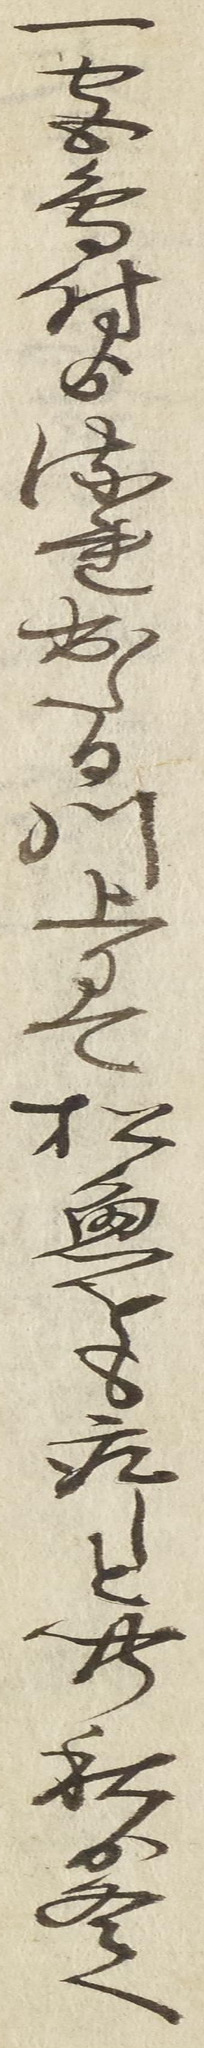一宮鳥時より流れ出たる川上にて松魚をも取しと聞秋より冬へ
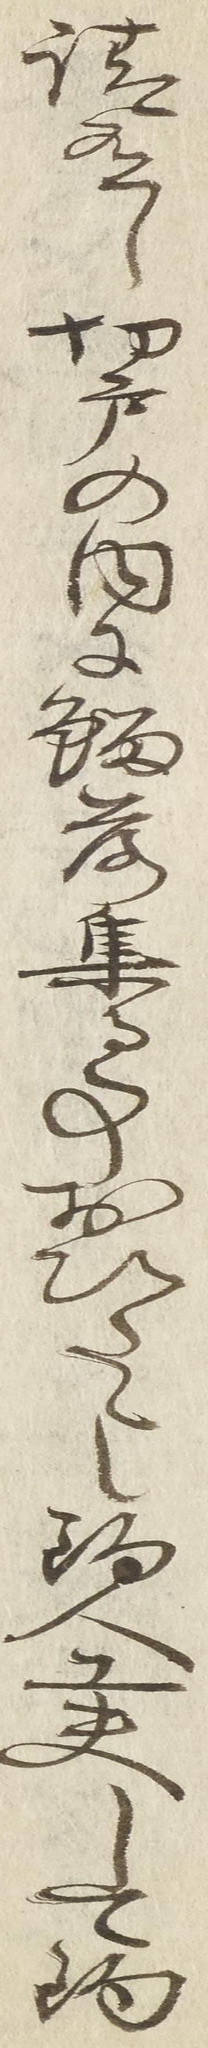請有し切戸の内に鯔落集る事おひたゝし釣人工夫して釣
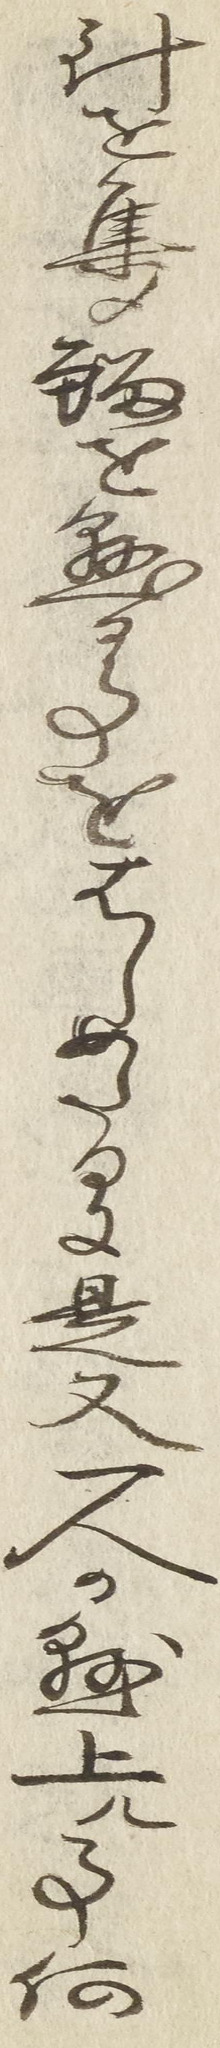針を集め鯔を懸る事をはしめたるに是又一人か懸上る事何
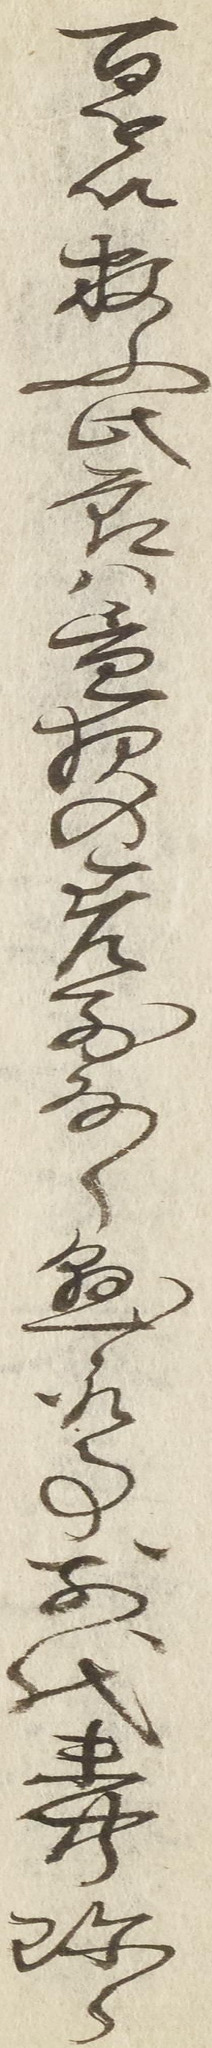百を以て数ふ此節は昼夜の差別なく懸取る事前代未聞珍ら
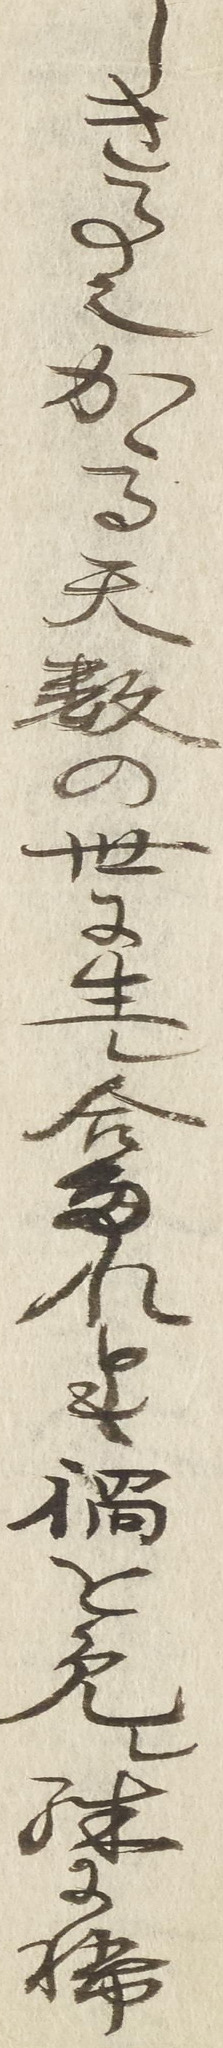しき事也かゝる天数の世に生れ合たれとも禍を免れ殊に稀
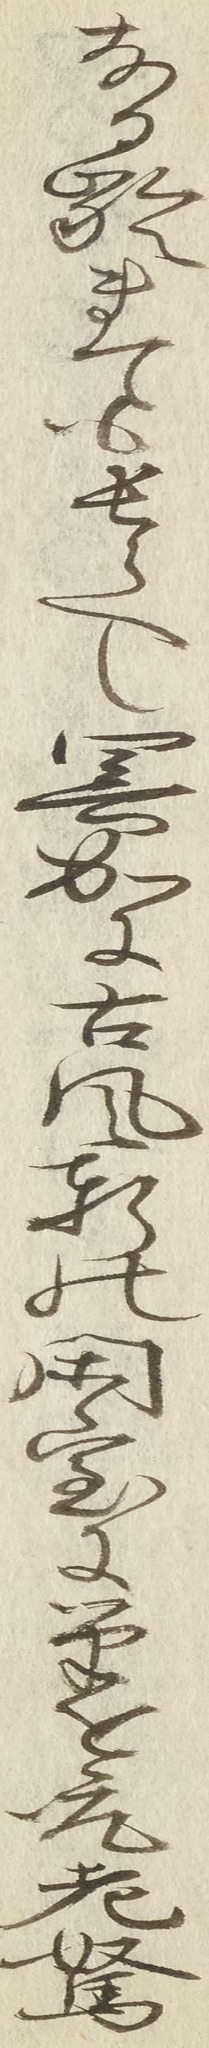なる齢までも長らへし冥加に古風斬の閑室に筆を取老駑
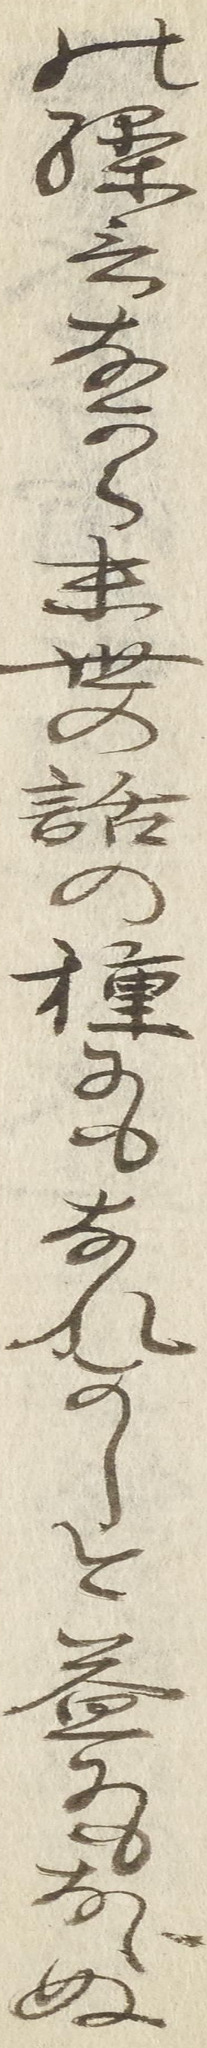の繰言なから末世の話の種にもあれかしと益にもならぬ
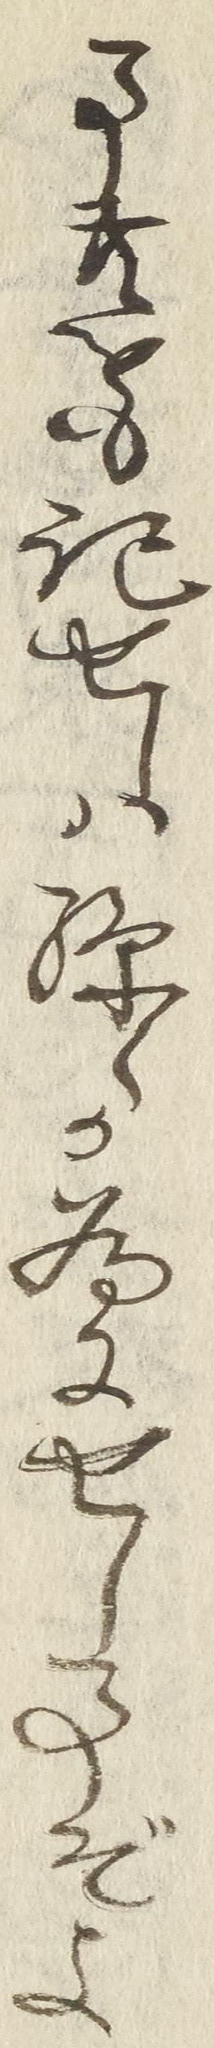事ともをも記せしは孫々か為にせし事ぞよ
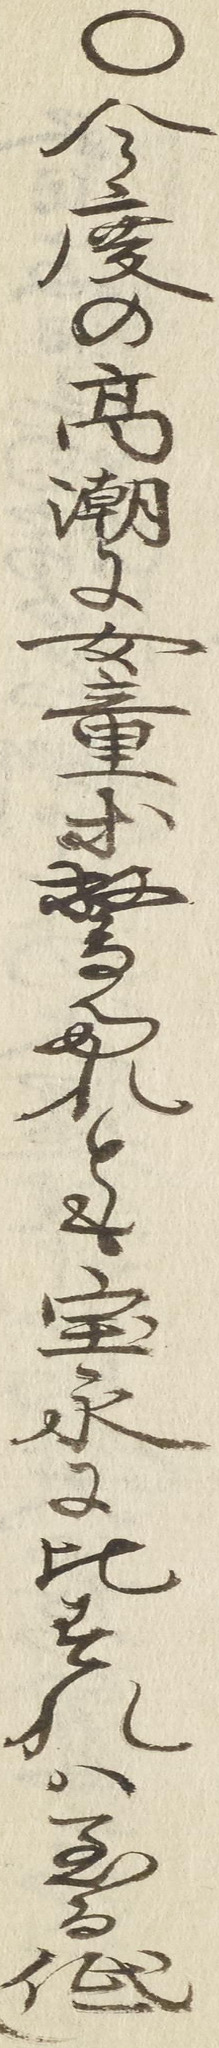〇今度の高潮に女童等驚たれとも宝永に比すれハ到て低し
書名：地震記　上
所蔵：東京大学地震研究所図書室 Earthquake Research Institute Library, The University of Tokyo, JAPAN
